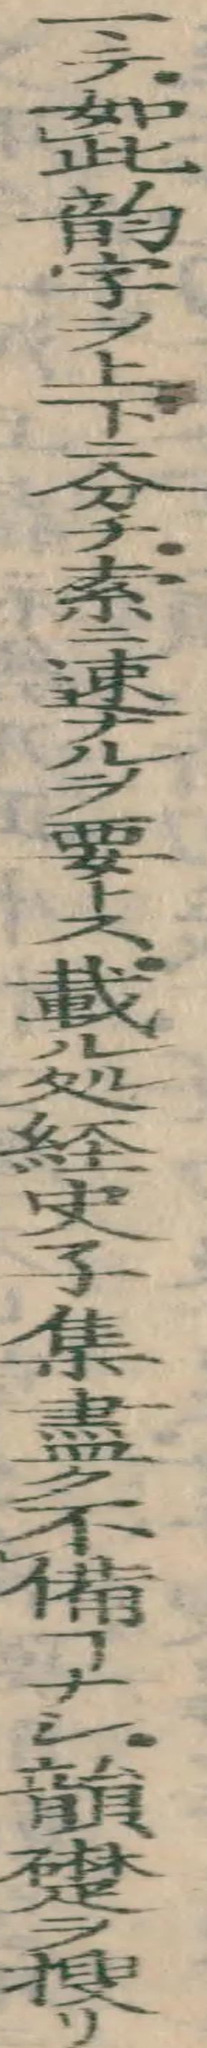マテ．如此韵字ヲ上下ニ分チ．索ニ速ナルヲ要トス．載ル処経史子集尽ク不備コトナシ．韻礎ヲ捜リ
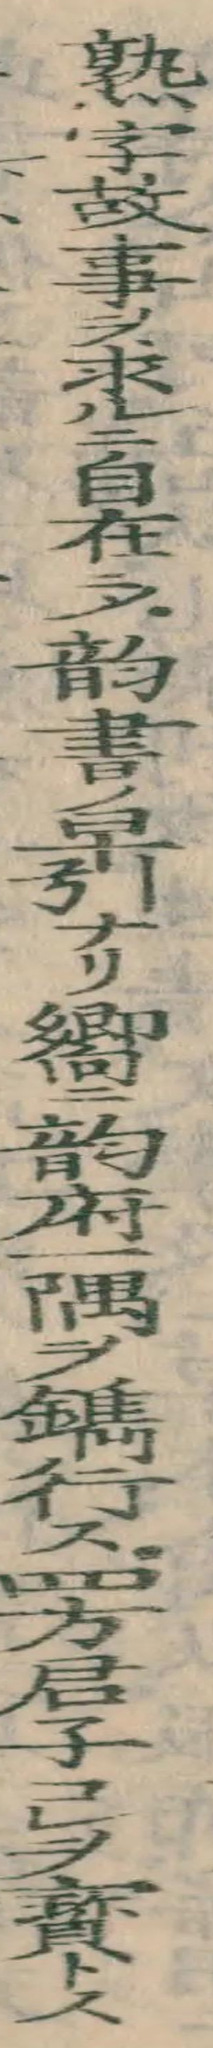熟字故事ヲ求ルニ自在ニシテ．韵書ノ早引ナリ嚮ニ韵府一隅ヲ鐫行ス．四方君子コレヲ宝トス
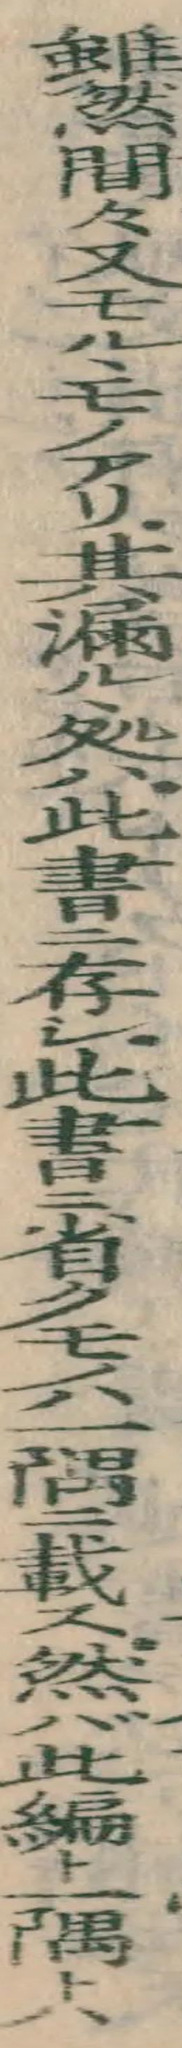雖然間々又モルヽモノアリ．其漏ルヽ処ハ．此書ニ存シ．此書ニ省クモノハ一隅ニ載ス．然バ此編ト一隅トハ
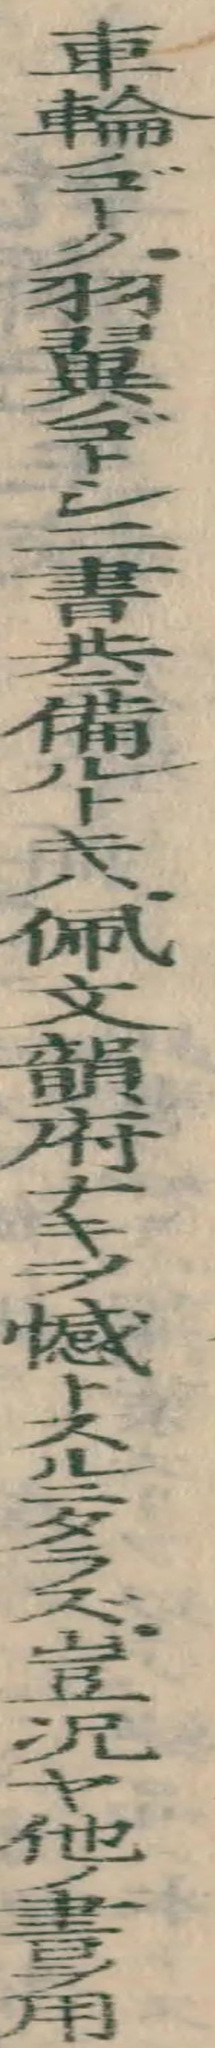車輪ノゴトク．羽翼ノゴトシ二書共ニ備ルトキハ．佩文韻府ナキヲ憾トスルニタラズ．豈況ヤ他ノ書ヲ用
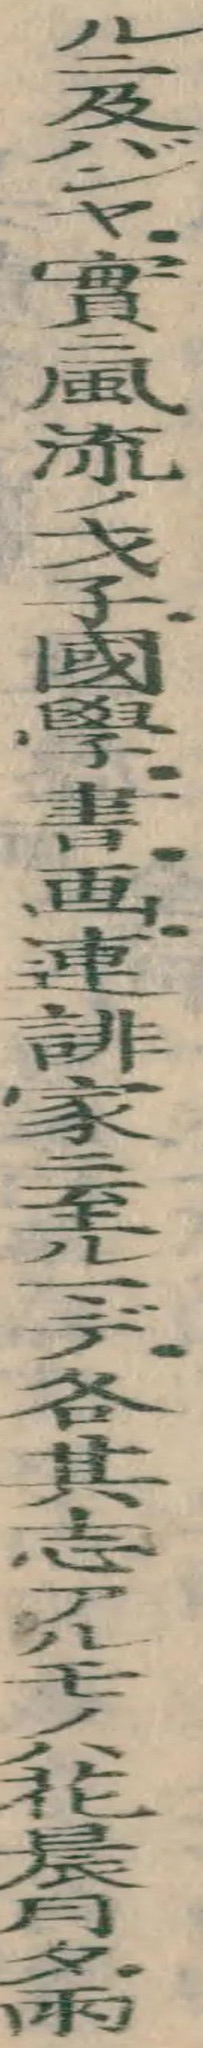ルニ及バンヤ．実ニ風流ノ才子．国学．書．画．連誹家ニ至ルマデ．各其志アルモノハ花晨月夕．雨
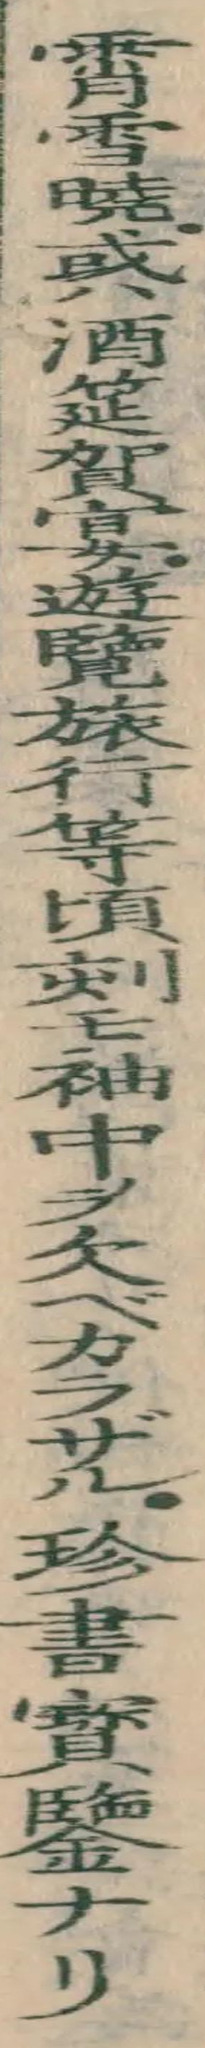霄雪暁．或ハ酒筵賀宴．遊覧旅行等頃刻モ袖中ヲ欠ベカラザル．珍書宝鑑ナリ
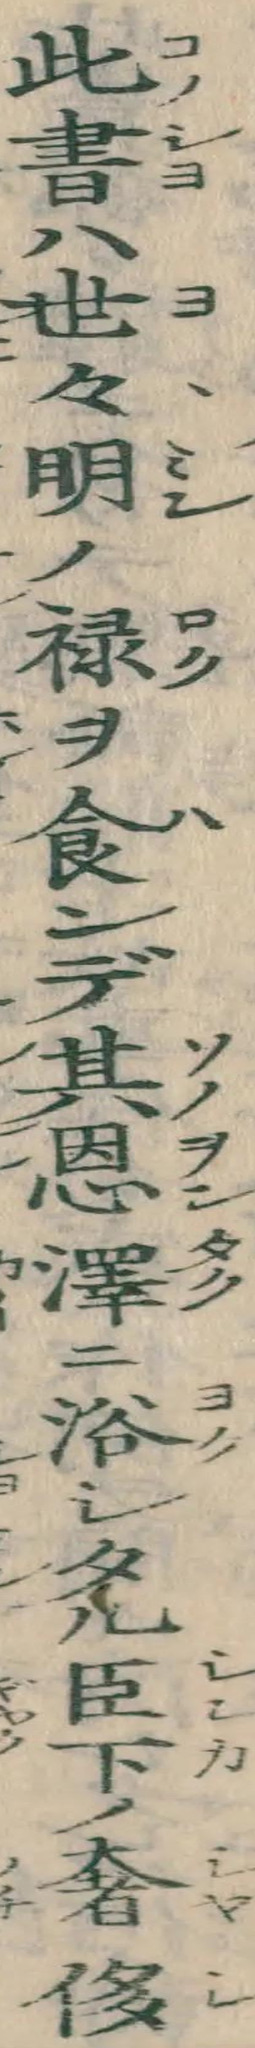此書ハ世々明ノ禄ヲ食ンデ其恩沢ニ浴シタル臣下ノ奢侈
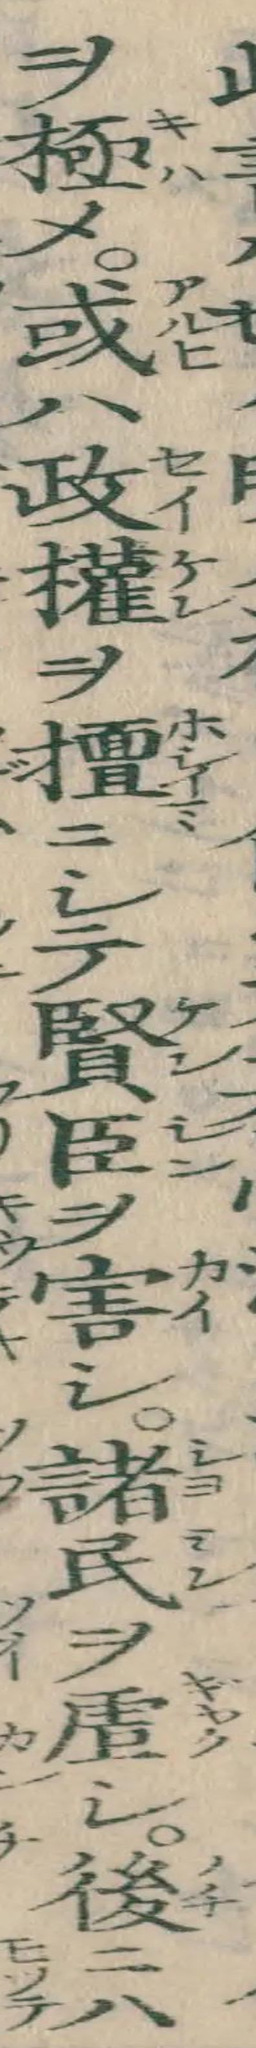ヲ極メ。或ハ政権ヲ擅ニシテ賢臣ヲ害シ。諸民ヲ虐シ。後ニハ
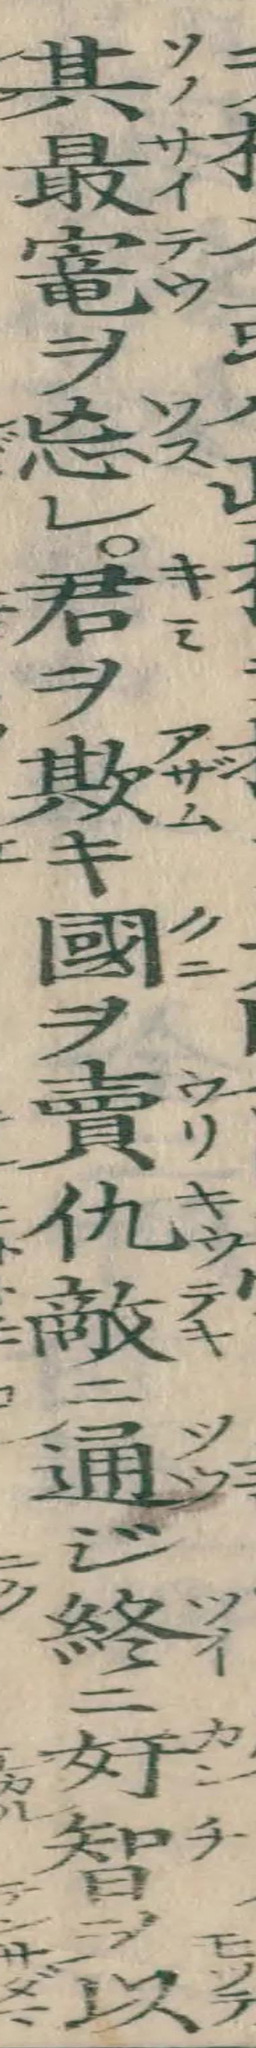其最寵ヲ忘レ。君ヲ欺キ国ヲ売仇敵ニ通ジ終ニ奸智ヲ以
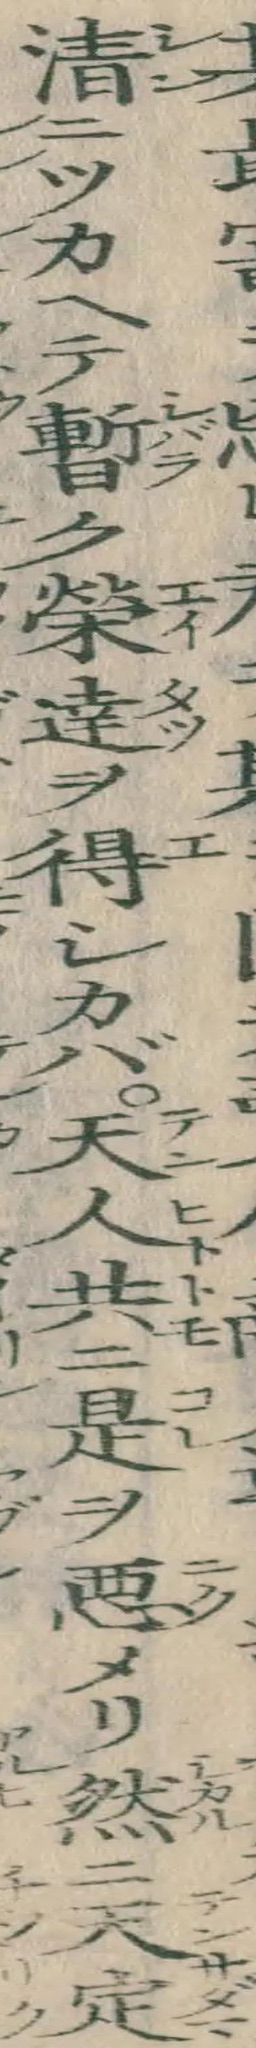清ニツカヘテ暫ク栄達ヲ得シカバ。天人共ニ是ヲ𢙣メリ然ニ天定
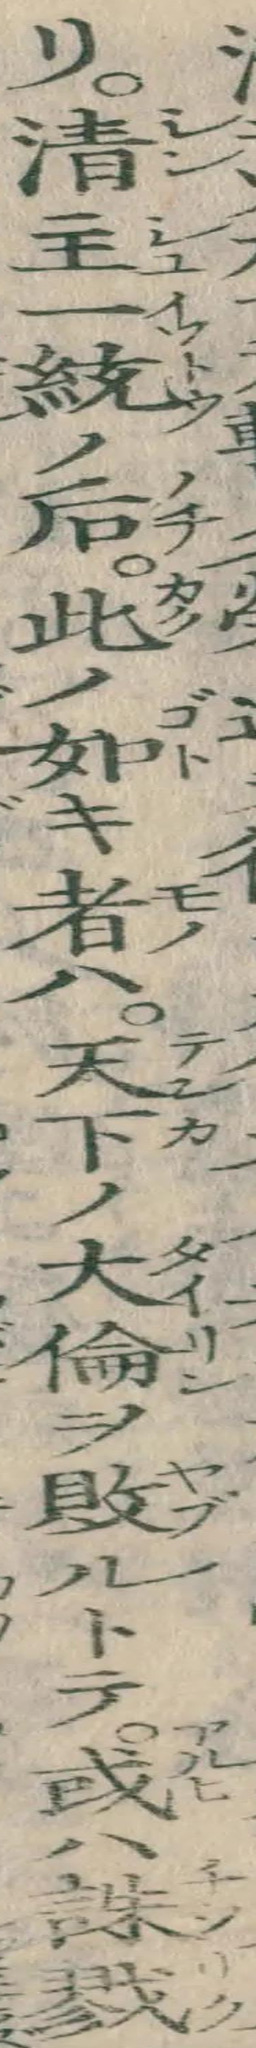リ。清主一統ノ后。此ノ如キ者ハ。天下ノ大倫ヲ敗ルトテ。或ハ誅戮
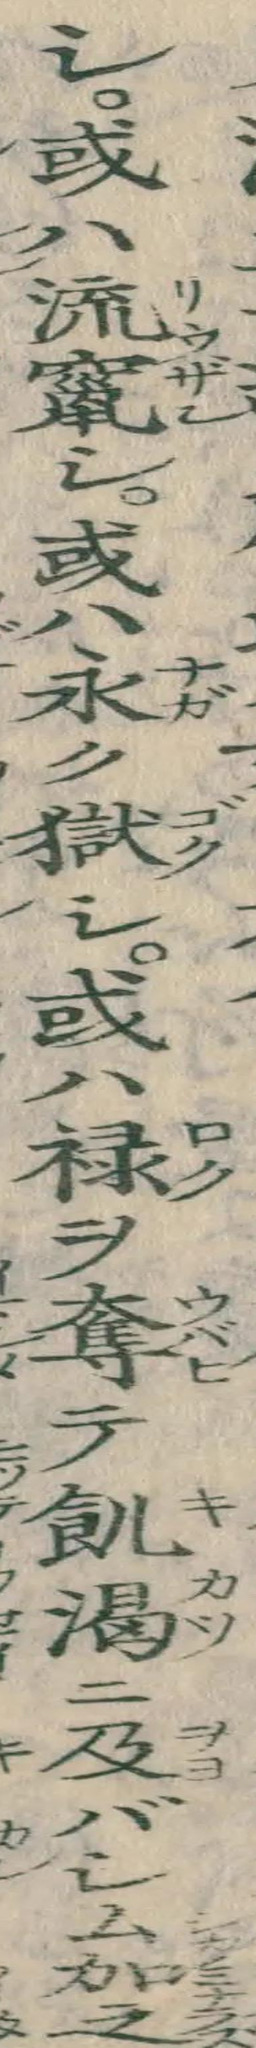シ。或ハ流竄シ。或ハ永ク獄シ。或ハ禄ヲ奪テ飢渇ニ及バシム加之
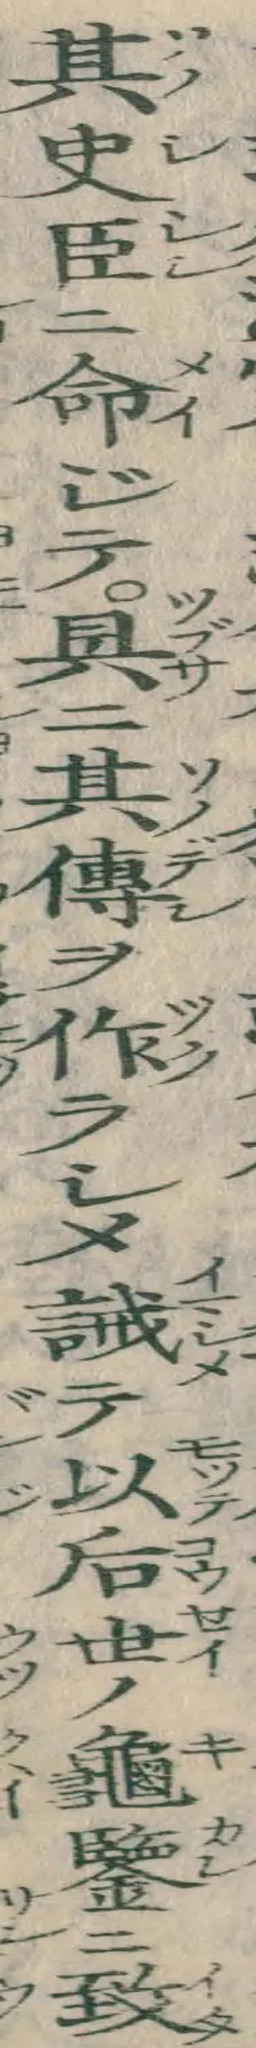其史臣ニ命ジテ。具ニ其伝ヲ作ラシメ誡テ以后世ノ亀鑑ニ致
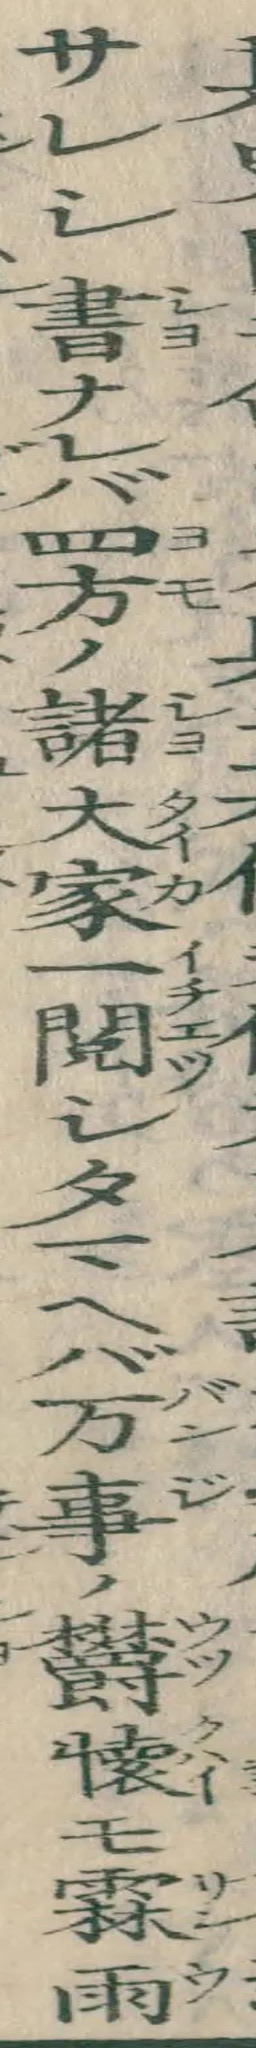サレシ書ナレバ四方ノ諸大家一閲シタマヘバ万事ノ鬱懐モ霖雨
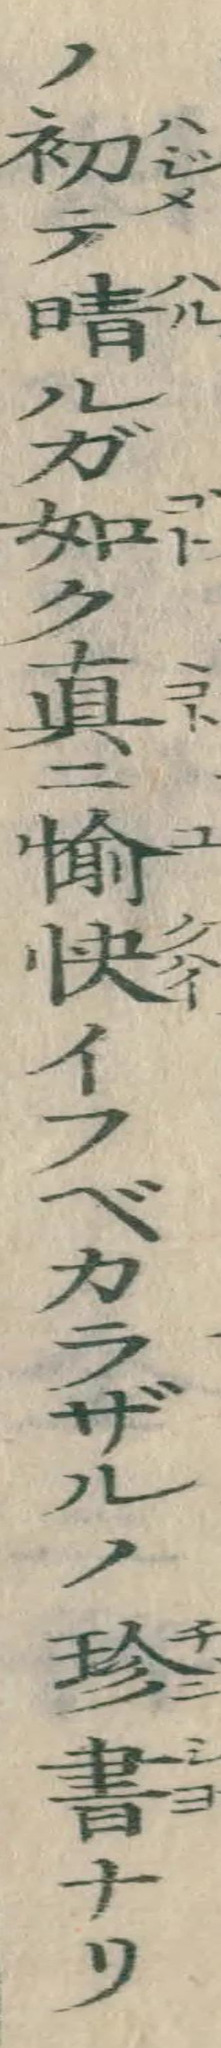ノ初テ晴ルガ如ク真ニ愉快イフベカラザルノ珍書ナリ
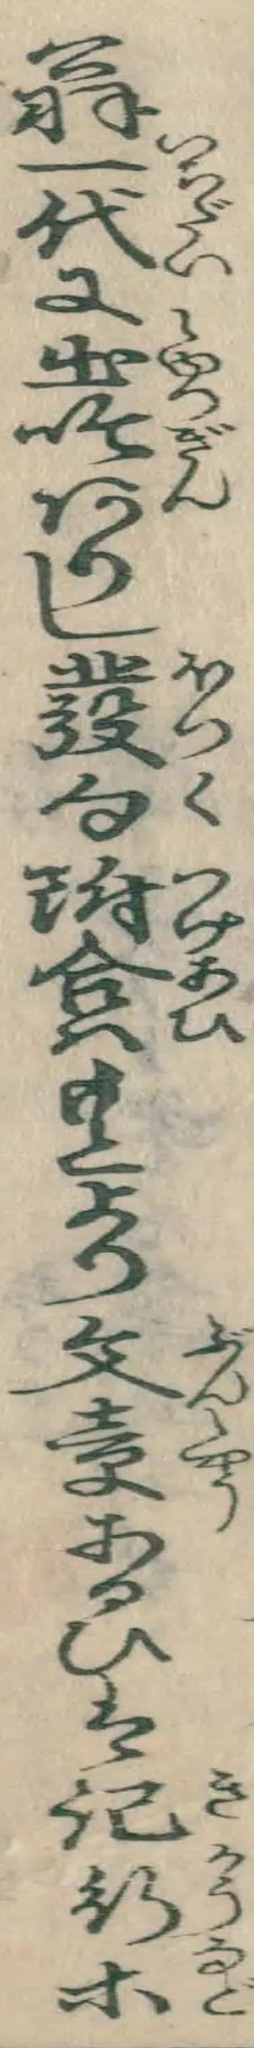翁一代に出吟ありし発句附合はもとより文章あるひは紀行等
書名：これこれ草 2巻. [2]
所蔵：国立国会図書館 National Diet Library, JAPAN
